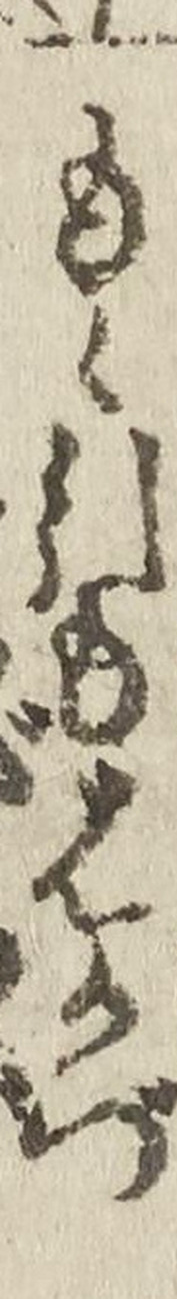もゝ引もはかづ
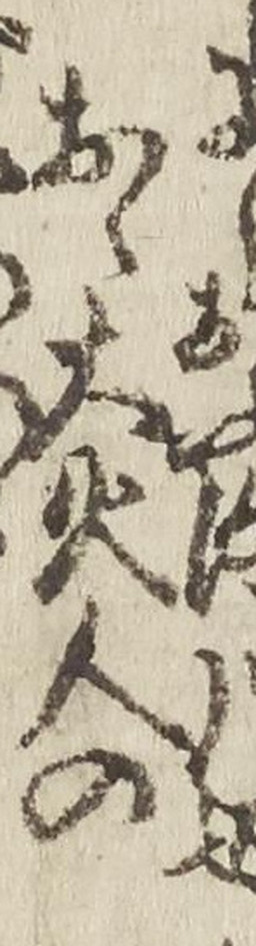おゝ大火人の
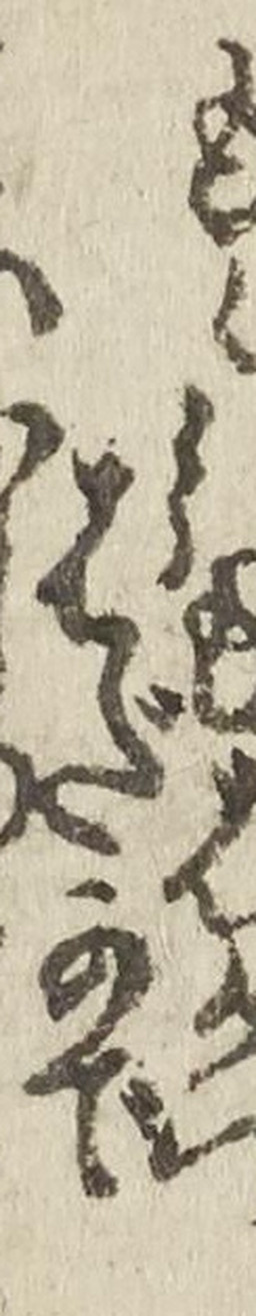はだかで
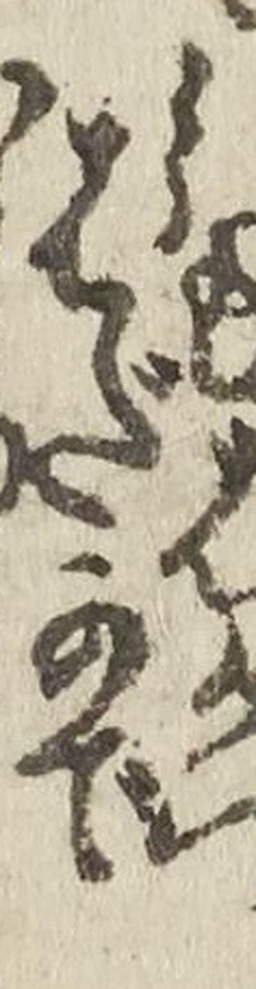はだかで
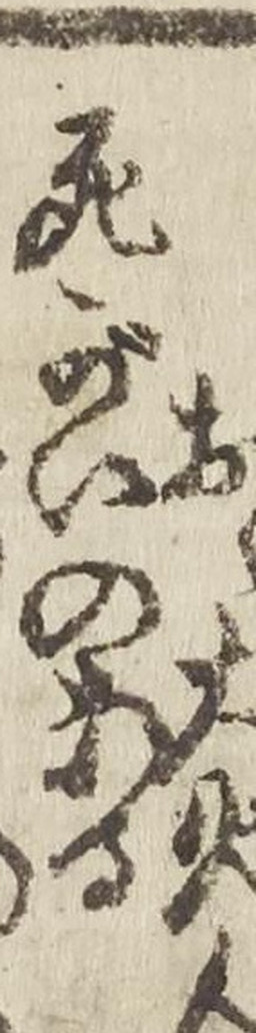死がいのある
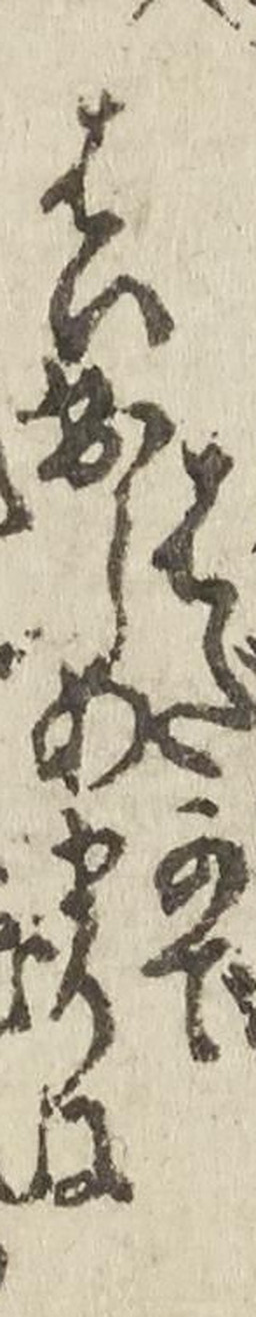はい出しあまりに
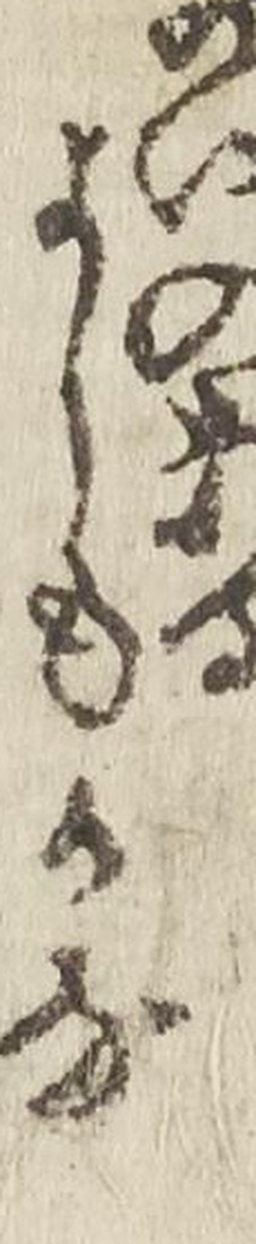よしもかな
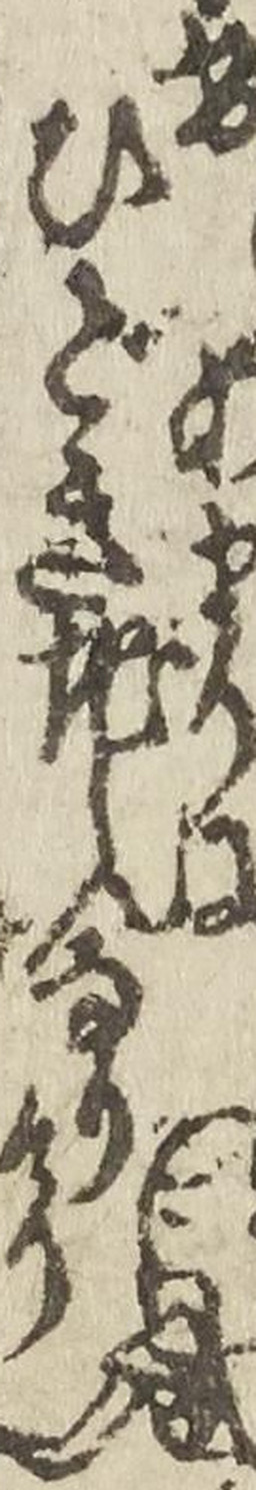ひどき地しんなりけり
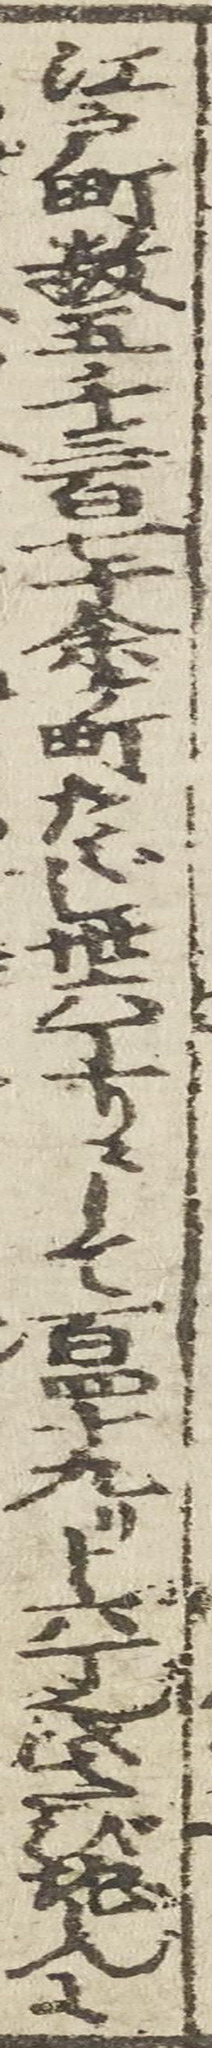江戸町数五千三百七十余ヶ町たゞし卅六丁一りにして百四十九リト六丁也此たび地しんに
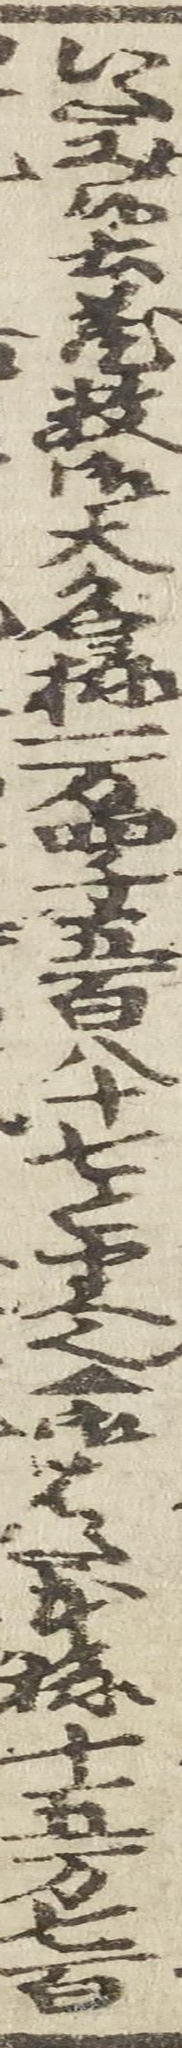いたみ候土蔵数御大名様一万一万四千五百八十七とまへ也▲御旗本様十五万七百
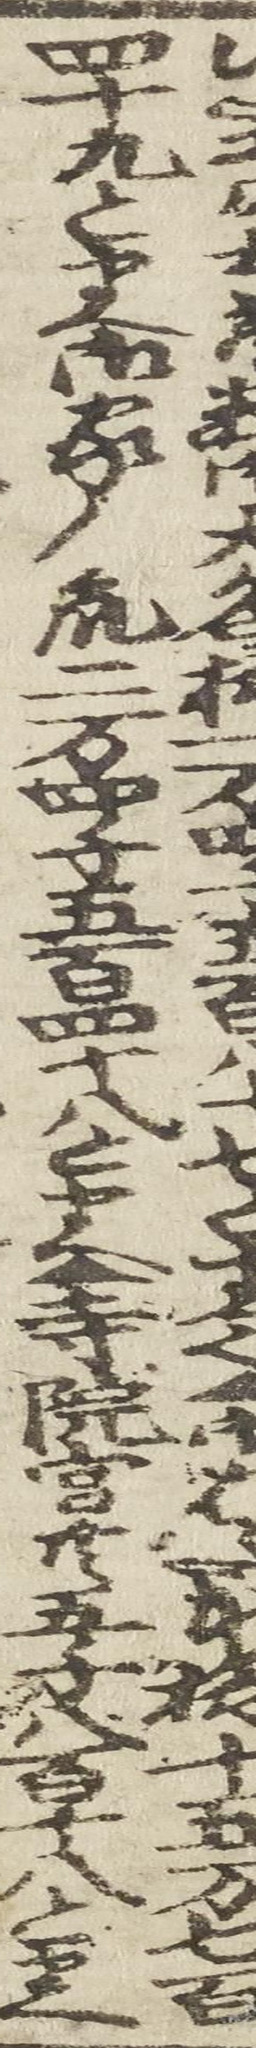四十九とまへ御家人？衆二万四千五百四十八とまへ▲寺院宮共五千八百十八とまへ
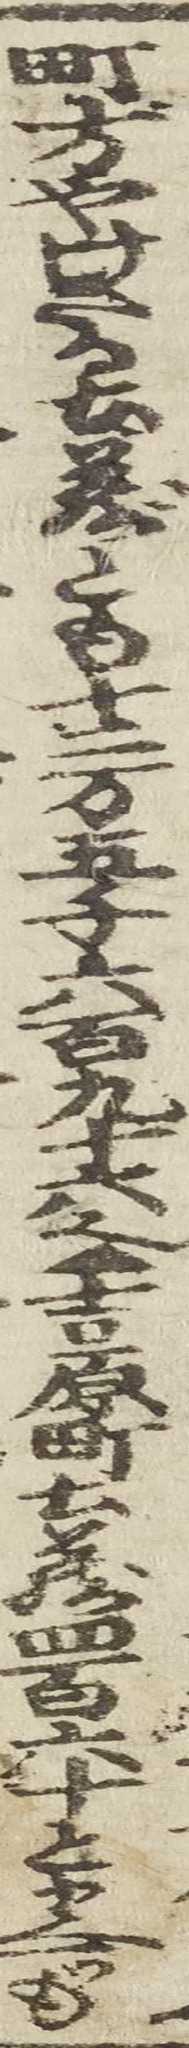町方やけたる土蔵とも十二万五千六百九十六也▲吉原町土蔵四百六十とまへ一ツも
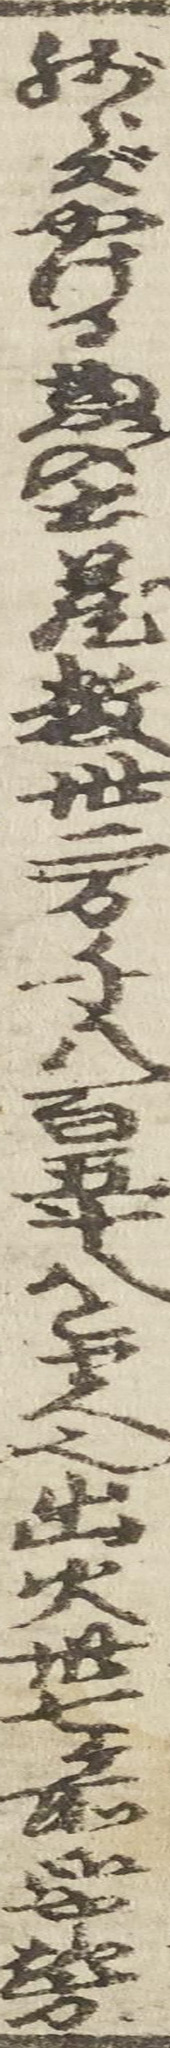残らずやける惣ノ〆土蔵数卅二万千八百五十八とまへ也出火卅七ヶ所御やしき方
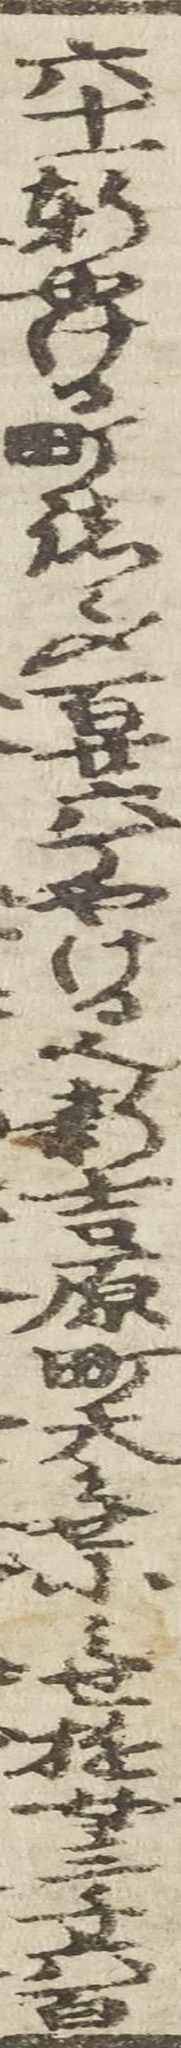六十一軒やける町諸々〆百廿六やける也新吉原町大みせ小みせ遊女三千六百
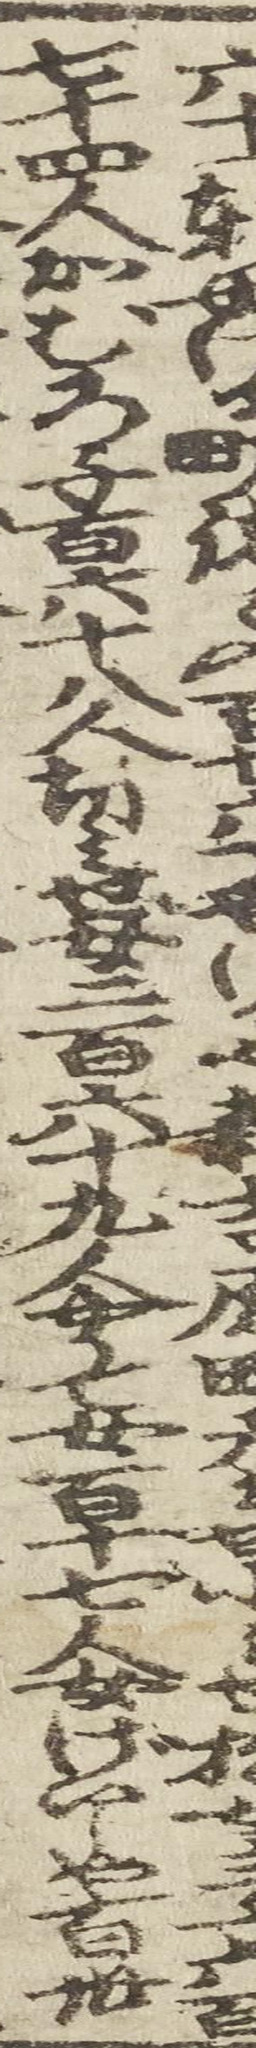七十四人かむろ千百六十八人切みせ女二百六十九人やりて女百十七人女げいしや百卅
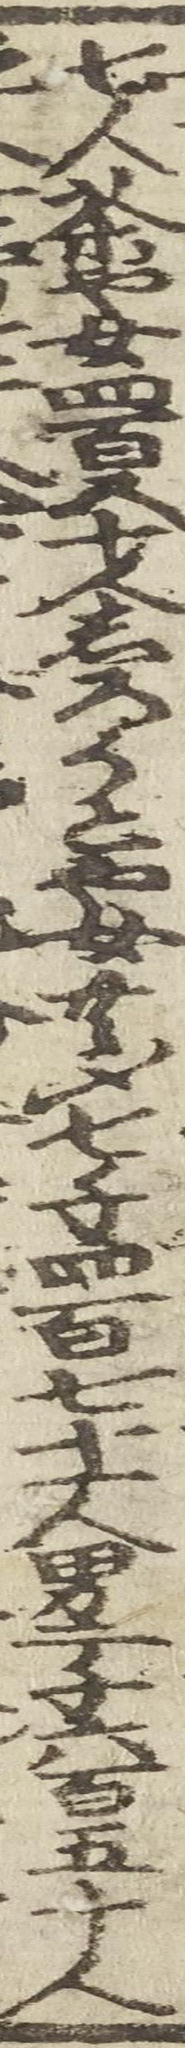七人茶や女四百五十人しろうとや女共〆七千四百七十一人男二千六百五十人
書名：しんぱん三十六哥仙
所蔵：東京大学地震研究所図書室 Earthquake Research Institute Library, The University of Tokyo, JAPAN
